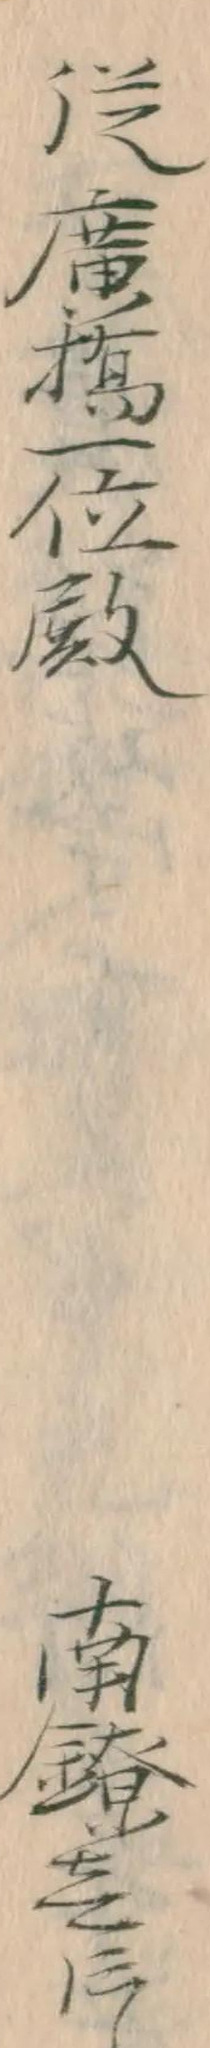従廣橋一位殿南鐐壱片
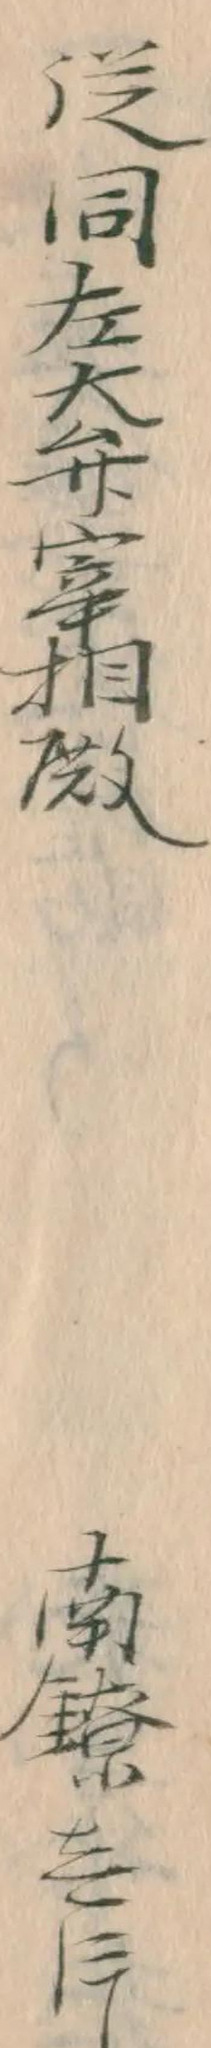従同左大弁宰相殿南鐐壱片
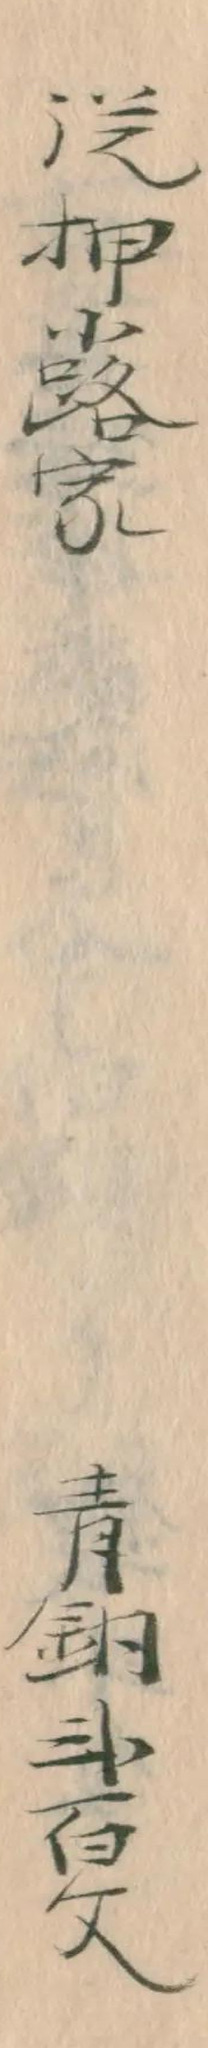従押小路家青銅弐百文
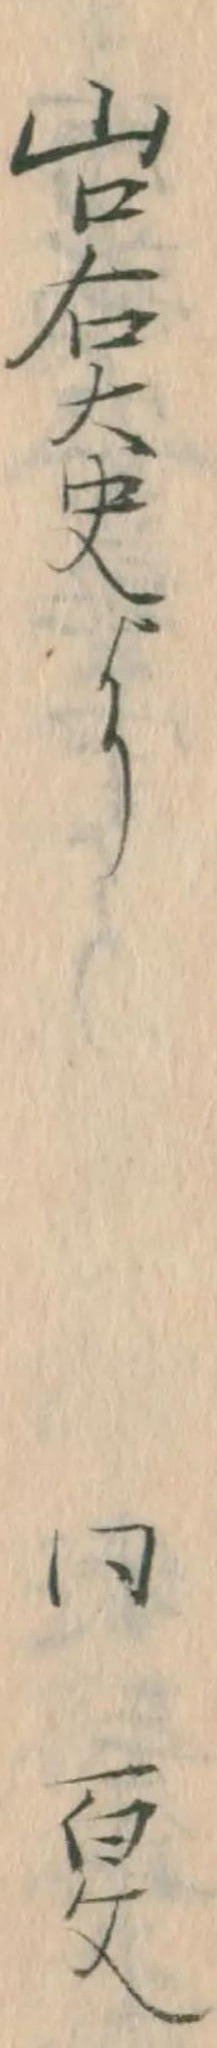山口右大史より同百文

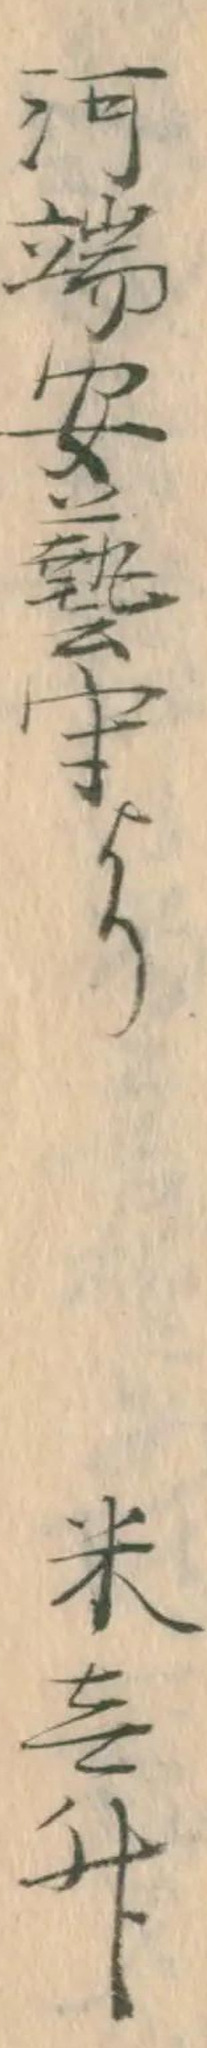河端安藝守より米壱升
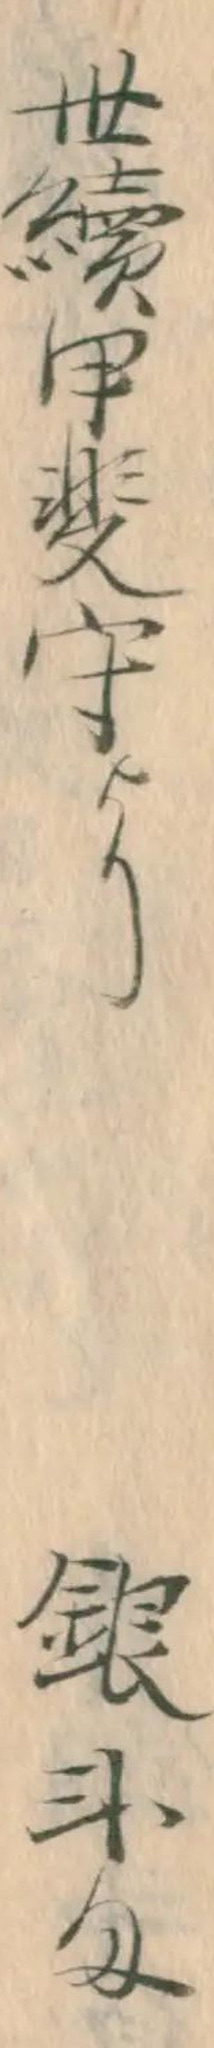世續甲斐守より銀弐匁
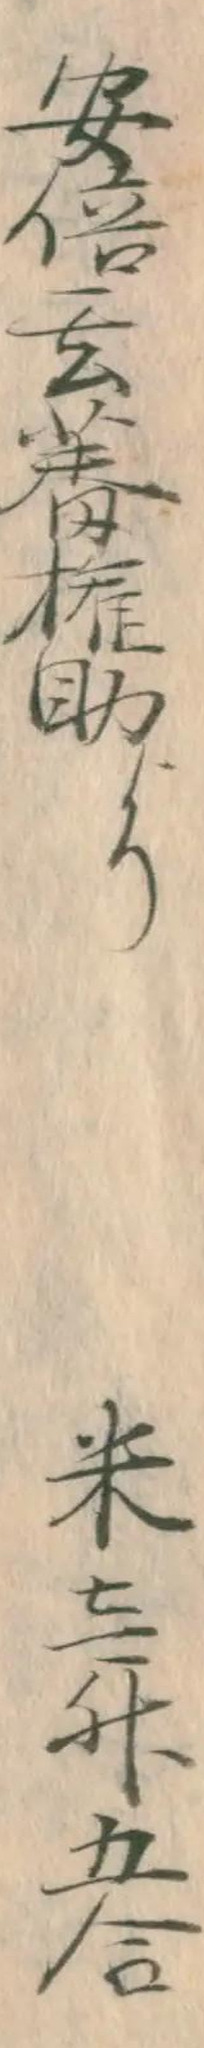安倍玄蕃権助より米壱升五合
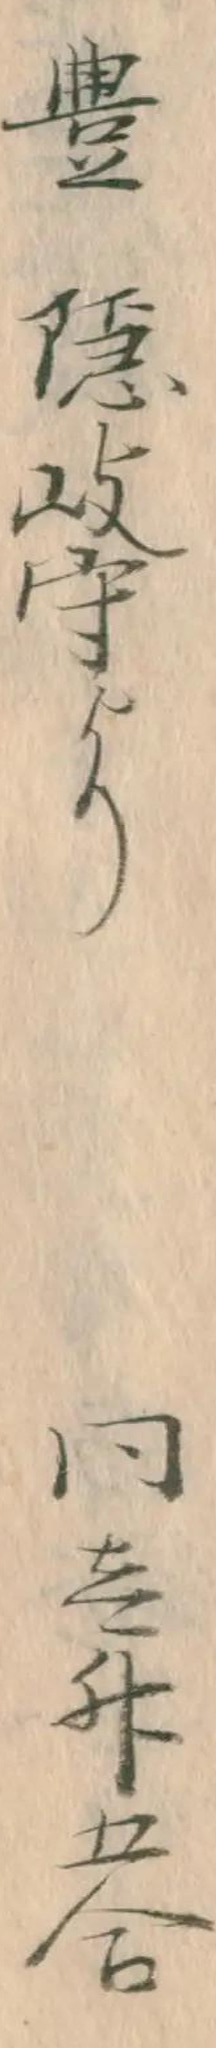豊隠岐守より同壱升五合
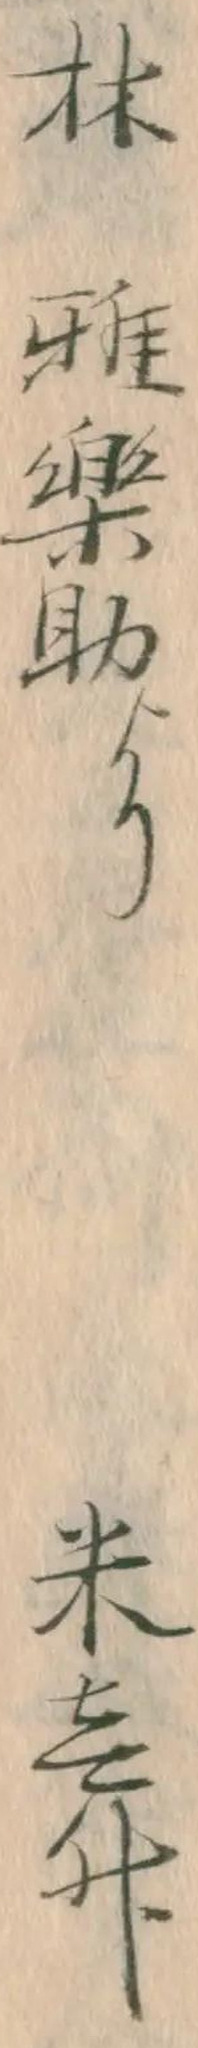林雅楽助より米壱升
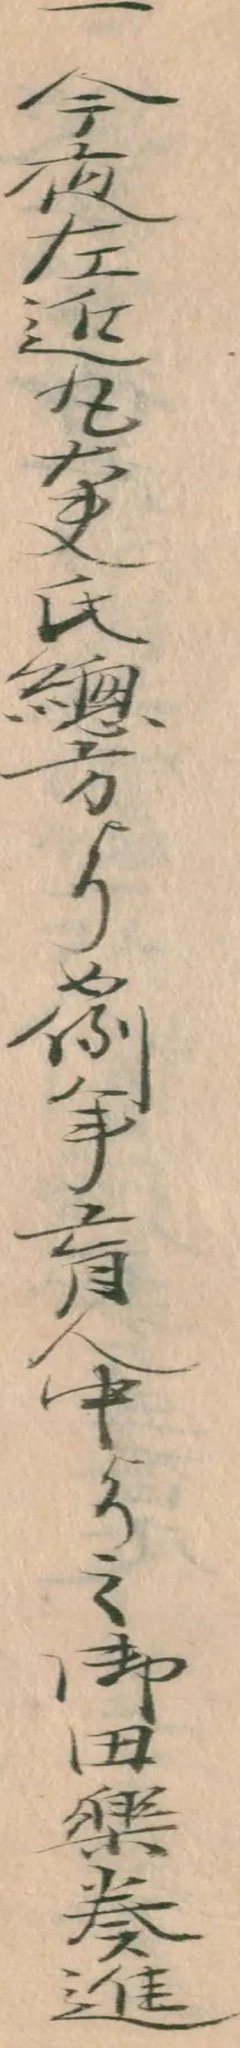一今夜左近丸大夫氏總方より如例年盲人中より之御田楽奏進
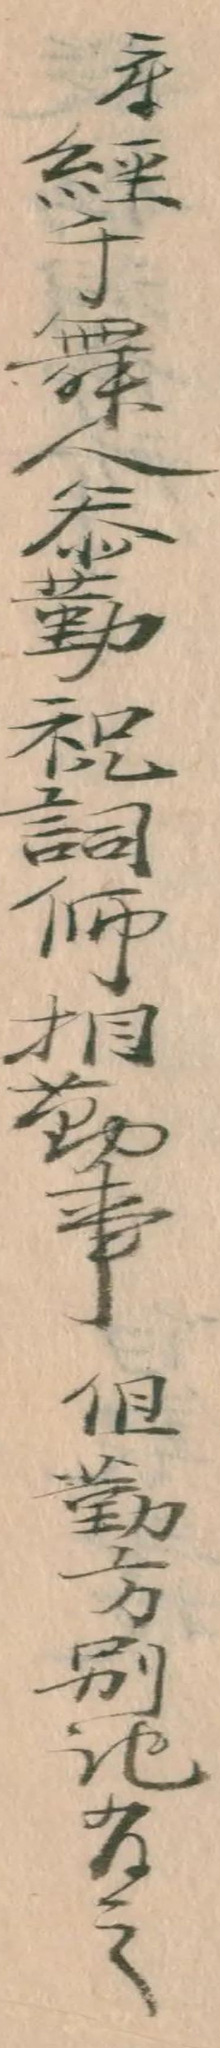ニ付経千舞人参勤祝詞師相勤事但勤方別記有之
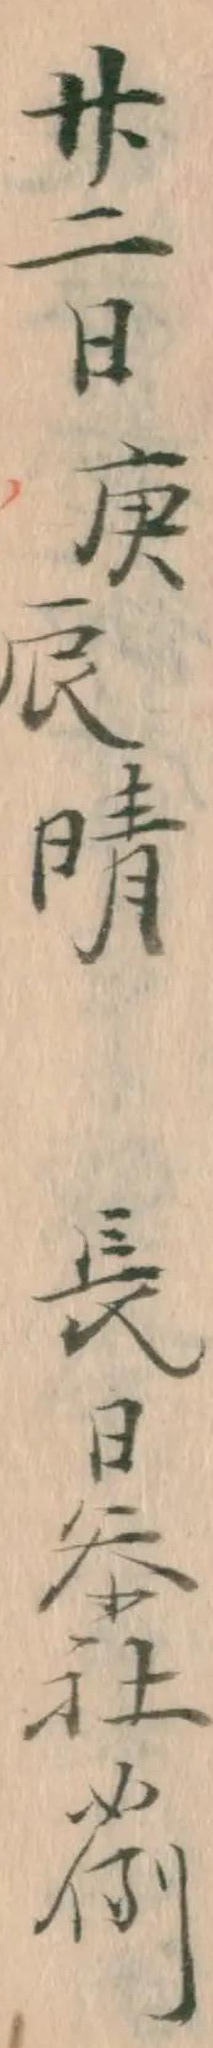廿二日庚辰晴長日参社如例
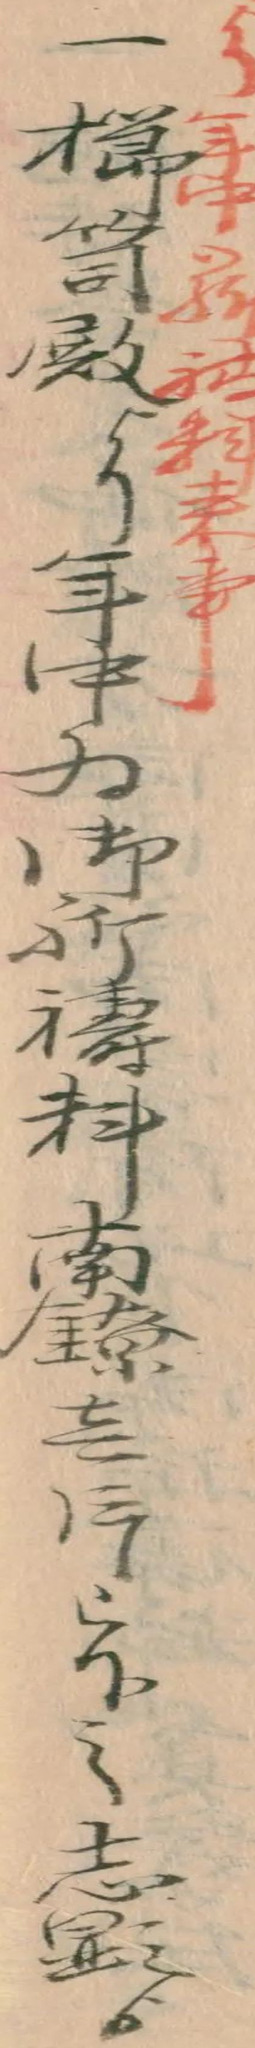一櫛笥殿より年中為御祈祷料南鐐壱片被下之志顕ゟ
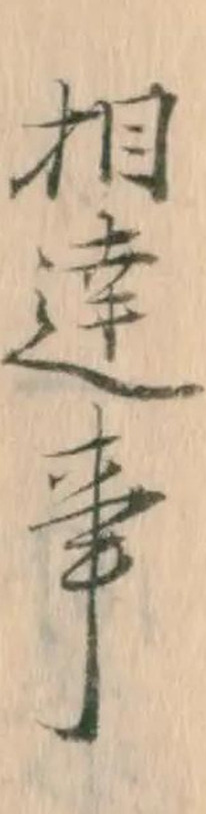相達事
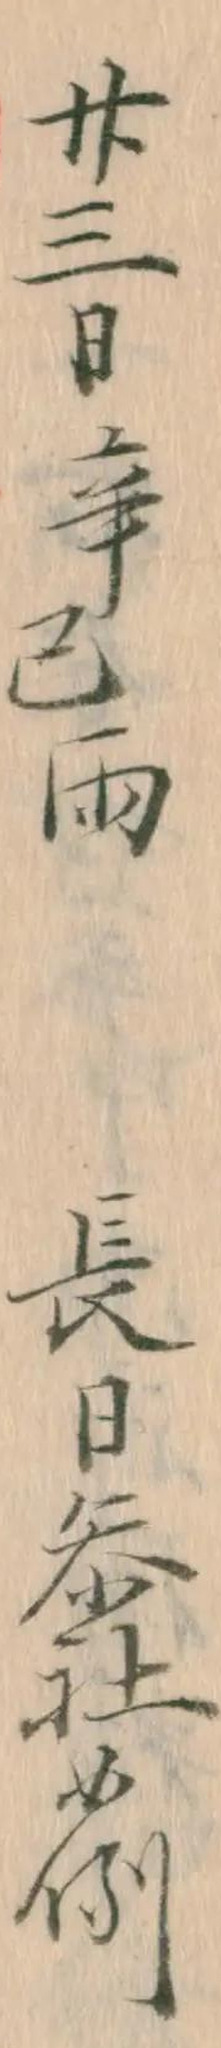廿三日辛巳雨長日参社如例
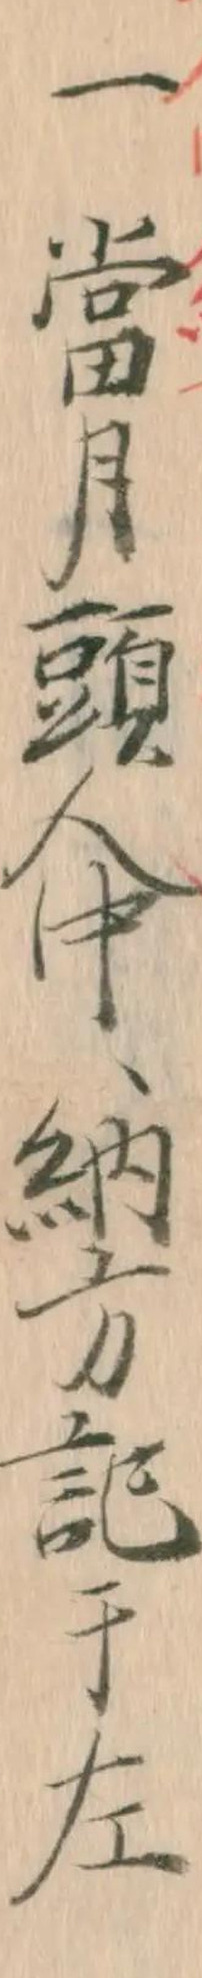一當月頭人中ヘ納方記于左
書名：賀茂社記録. 第74冊
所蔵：国立国会図書館 National Diet Library, JAPAN
